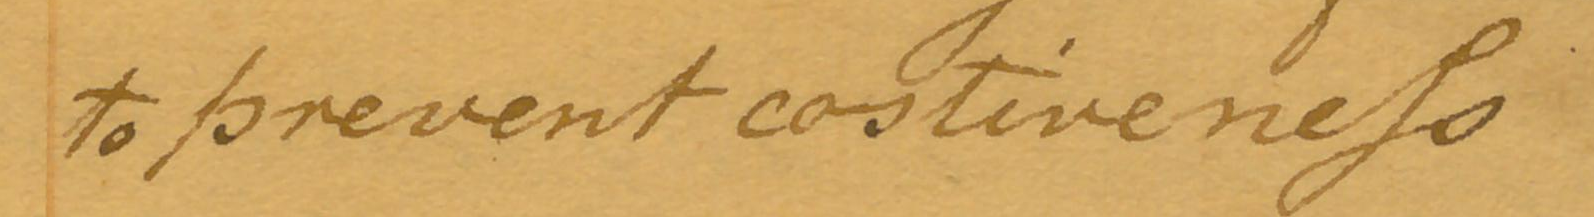to prevent costiveness
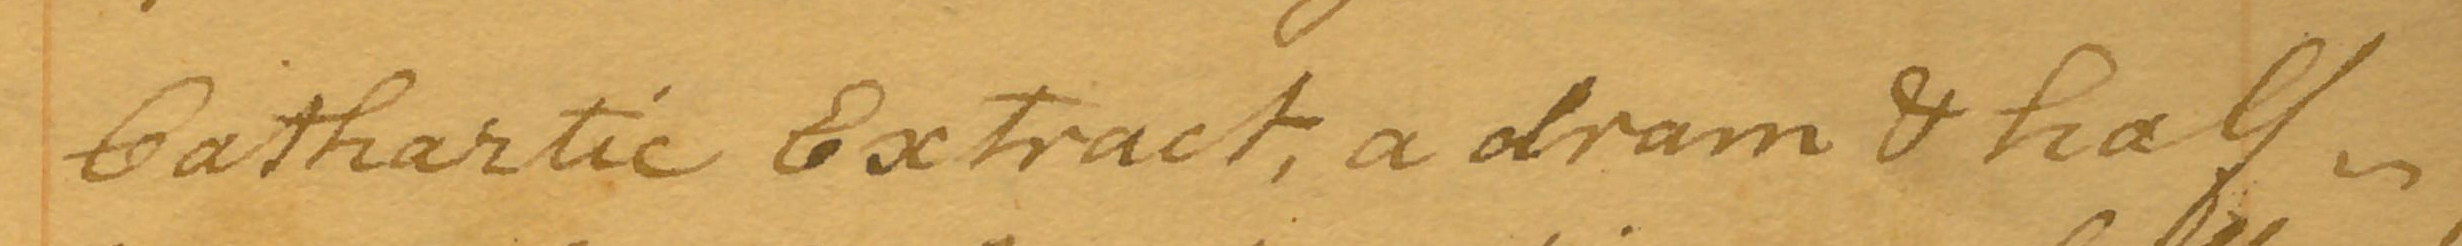Cathartic Extract, a dram & half
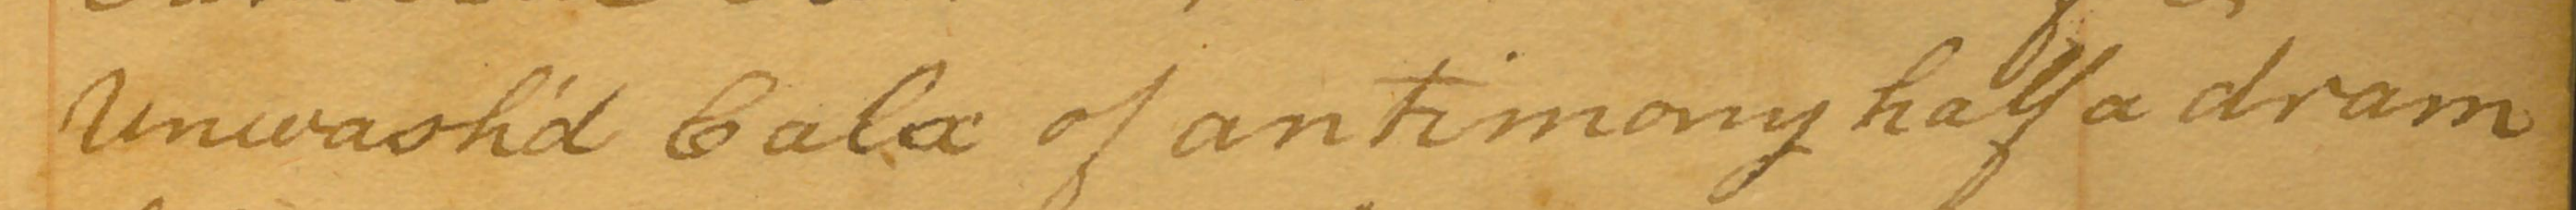Unwash'd Calx of antimony half a dram
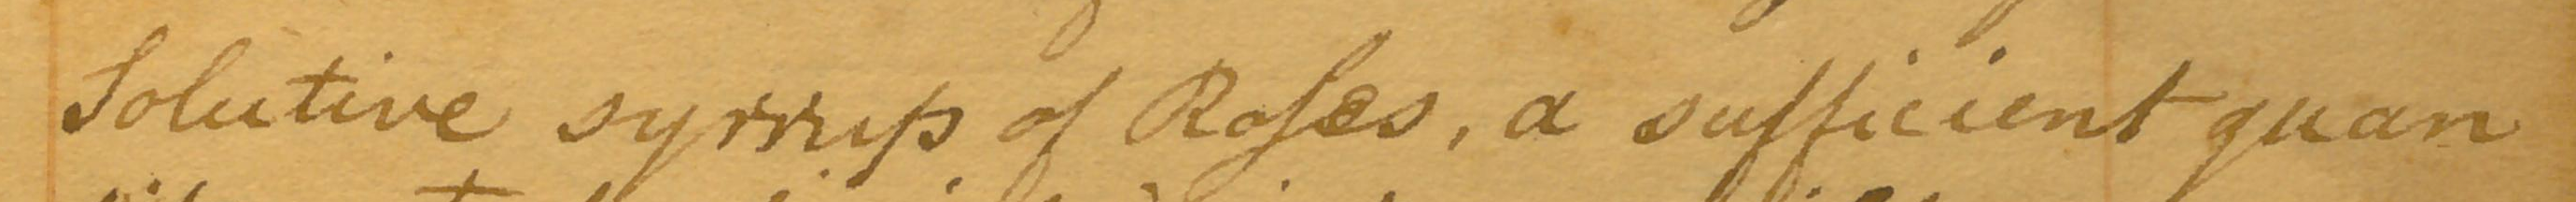solutive syrrup of Roses, a sufficient quan
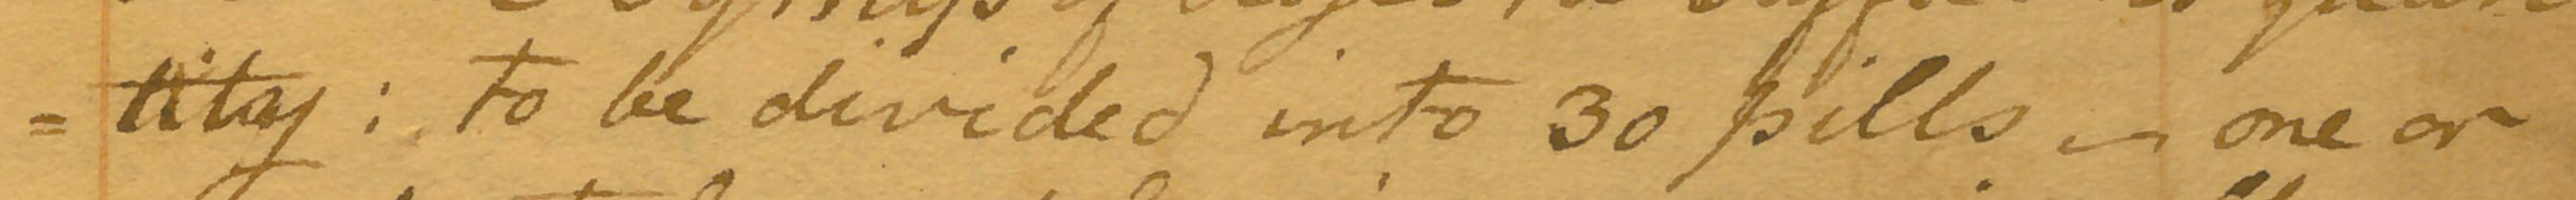-tity: to be divided into 30 pills- one or
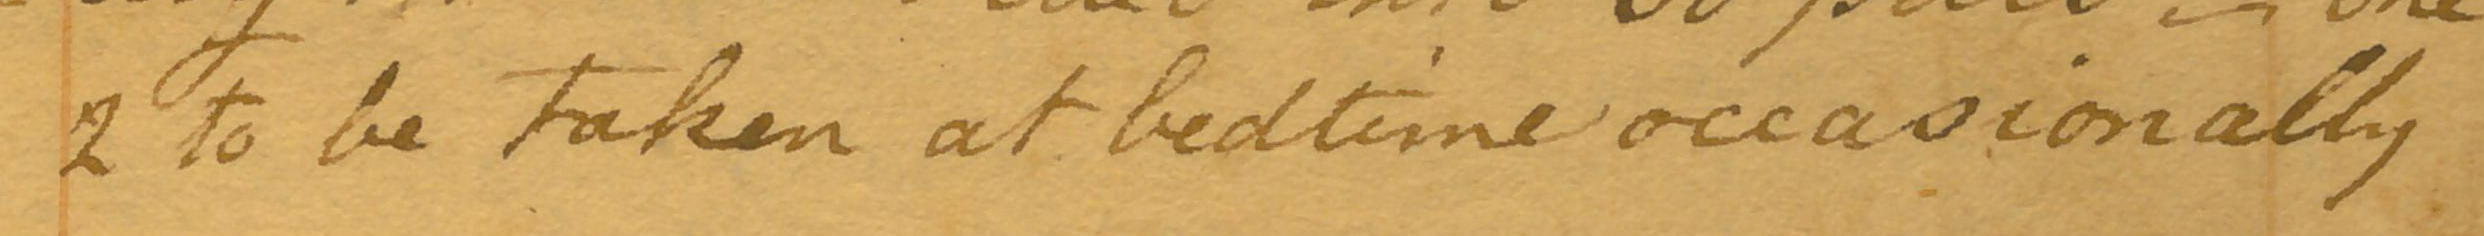2 to be taken at bedtime occasionally
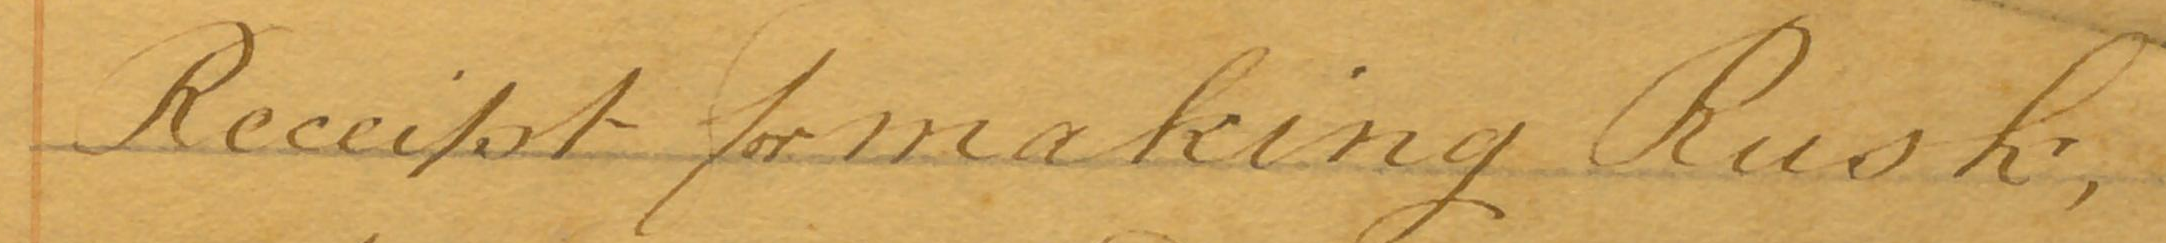Receipt for making Rusk
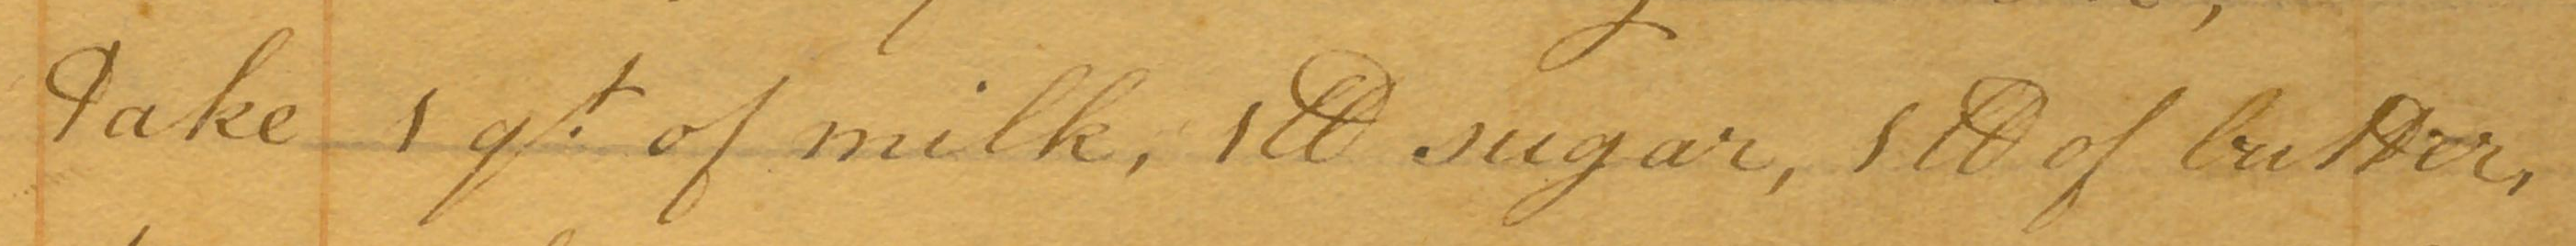Take 1 q^t. of milk, 1 lb sugar, 1 lb of butter,
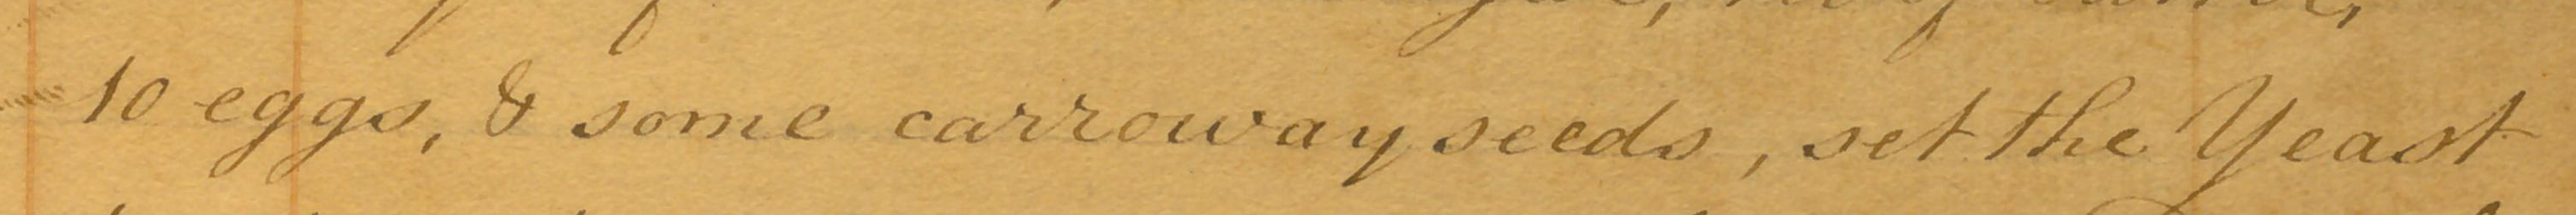10 eggs, & some carroway seeds, set the Yeast
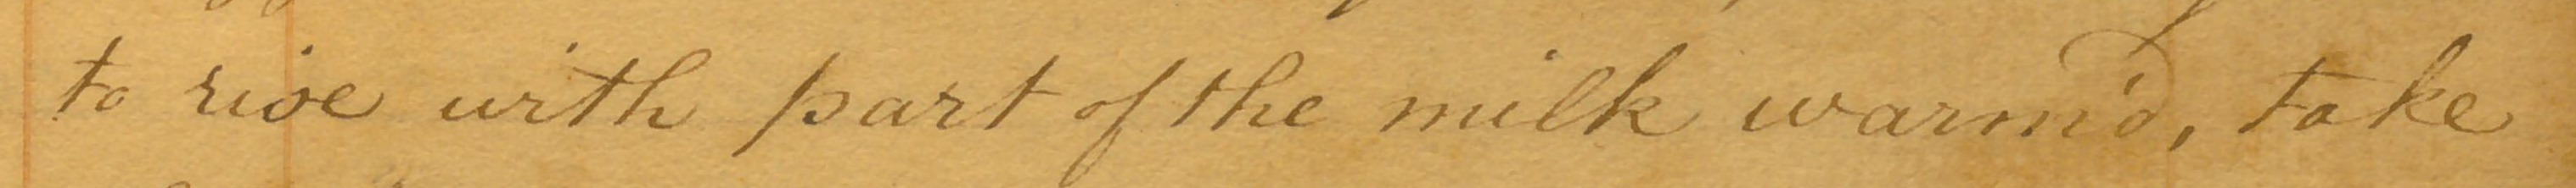to rise with part of the milk warm'd, take
